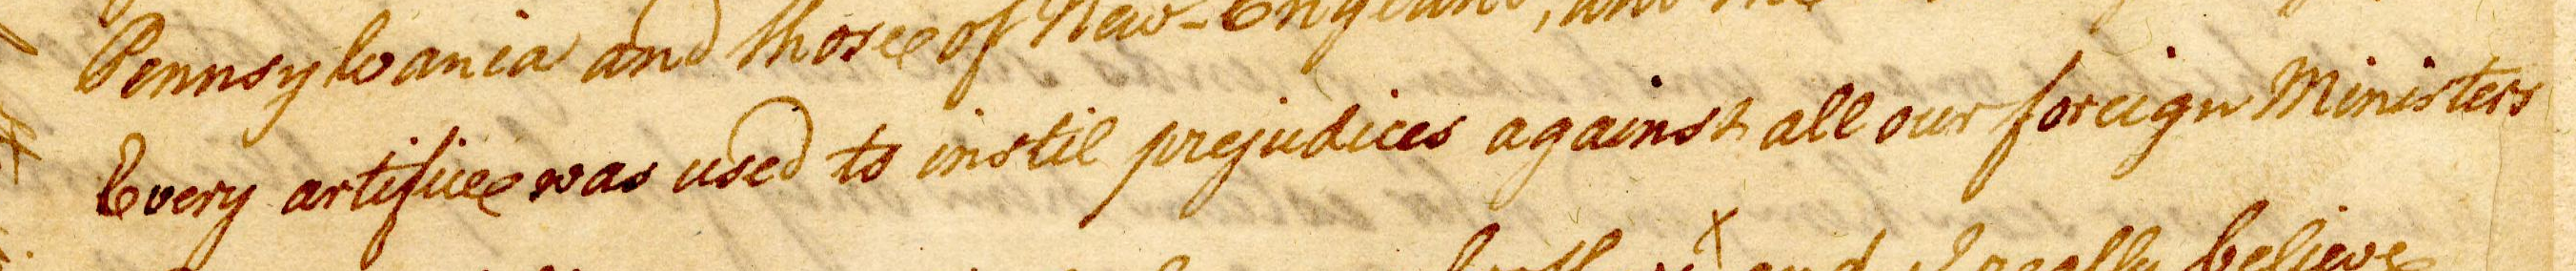Every artifice was used to instill prejudices against all our foreign Ministers
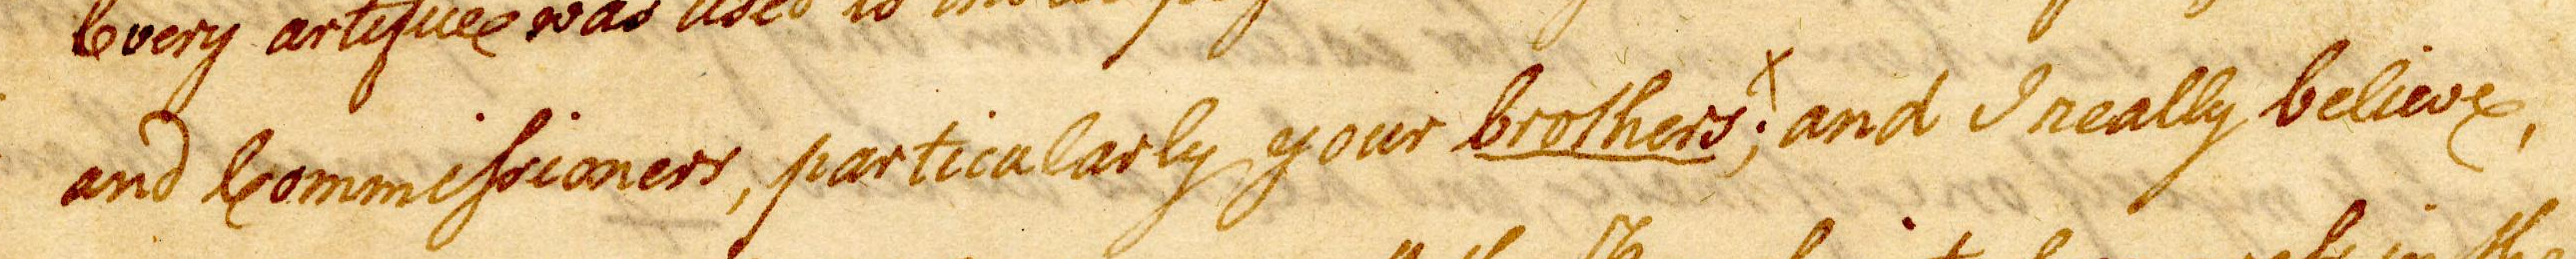and Commissioners, particularly your brothers; ^x and I really believe
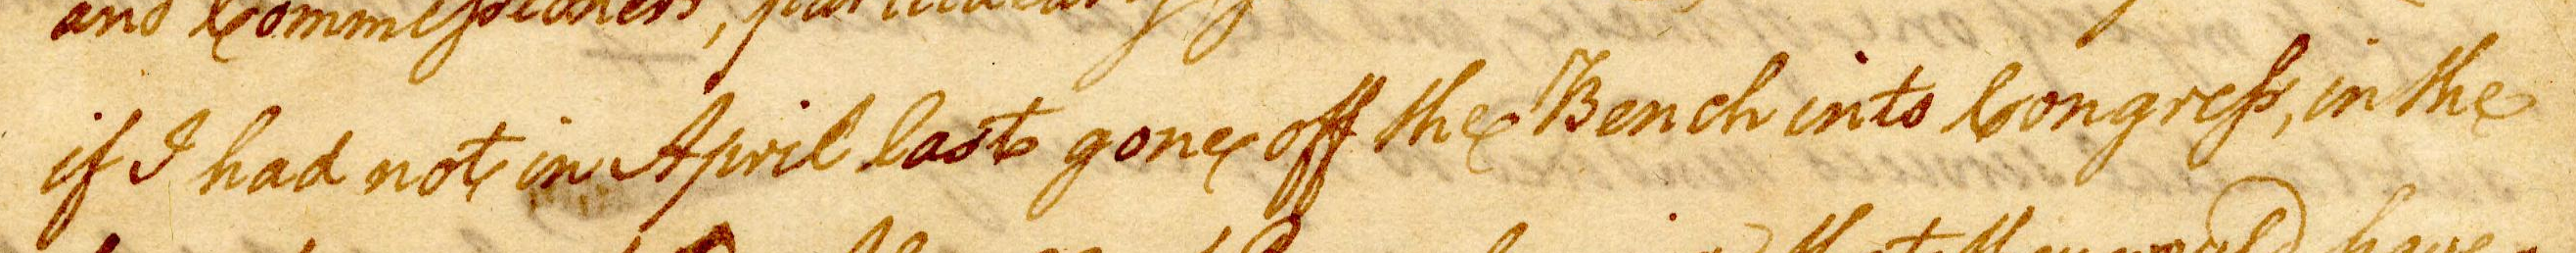if I had not in April last gone off the Bench into Congress in the
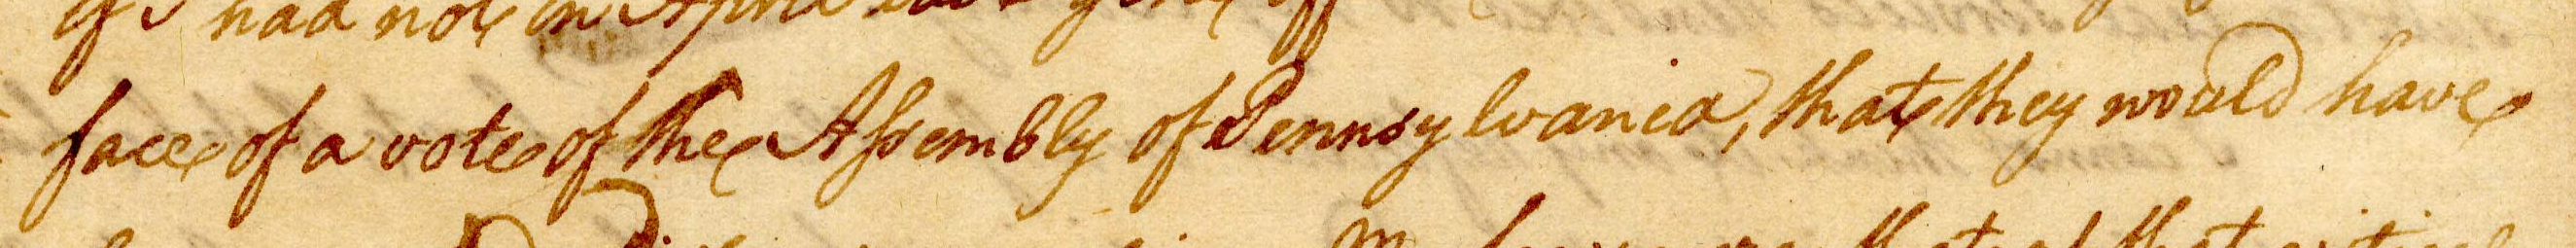faces of a vote of the Assembly of Pennsylvania that they would have
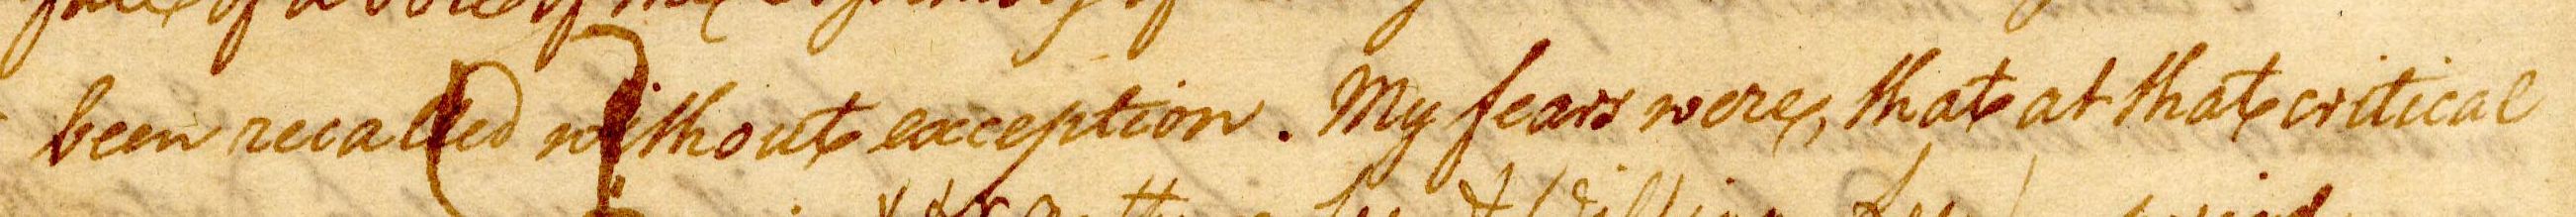been recalled without exception. My fears were, that at that critical
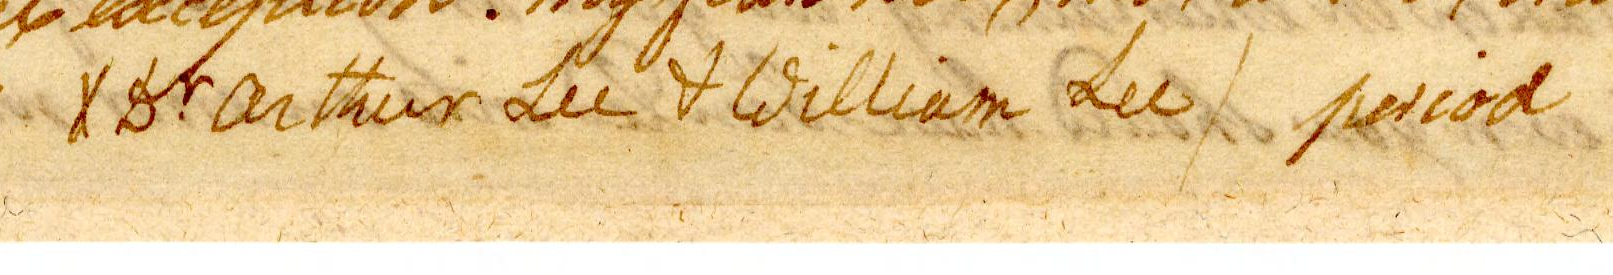X D^r Arthur Lee & William Lee period
